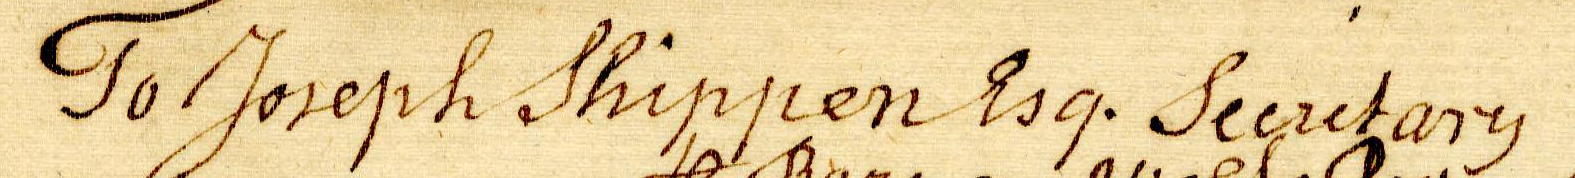To Joseph Shippen Esq. Secretary
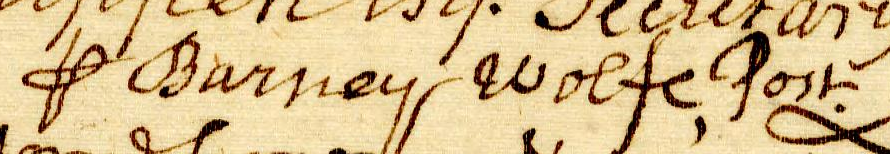per Barney Wolfe, Post.
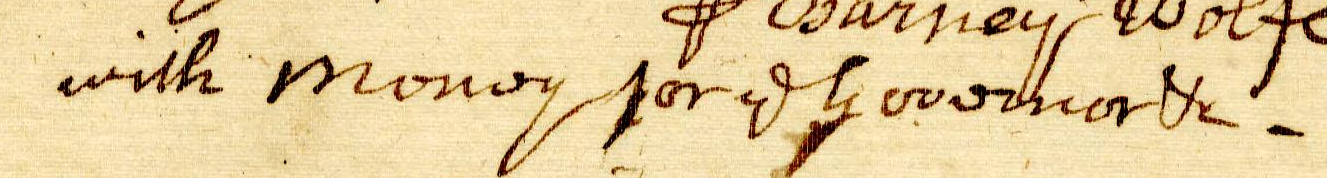with Money for y^e Governor &c-
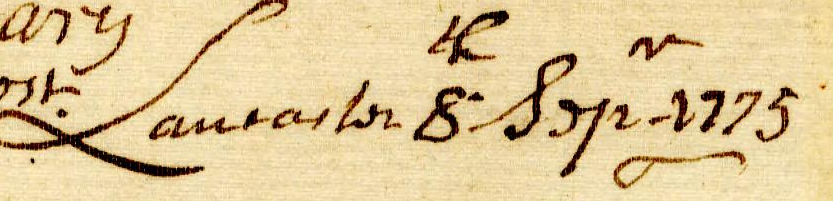Lancaster 8.^th Sep^r- 1775
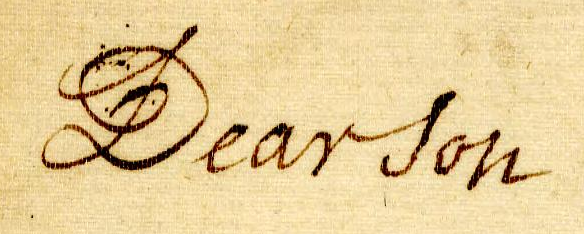Dear Son
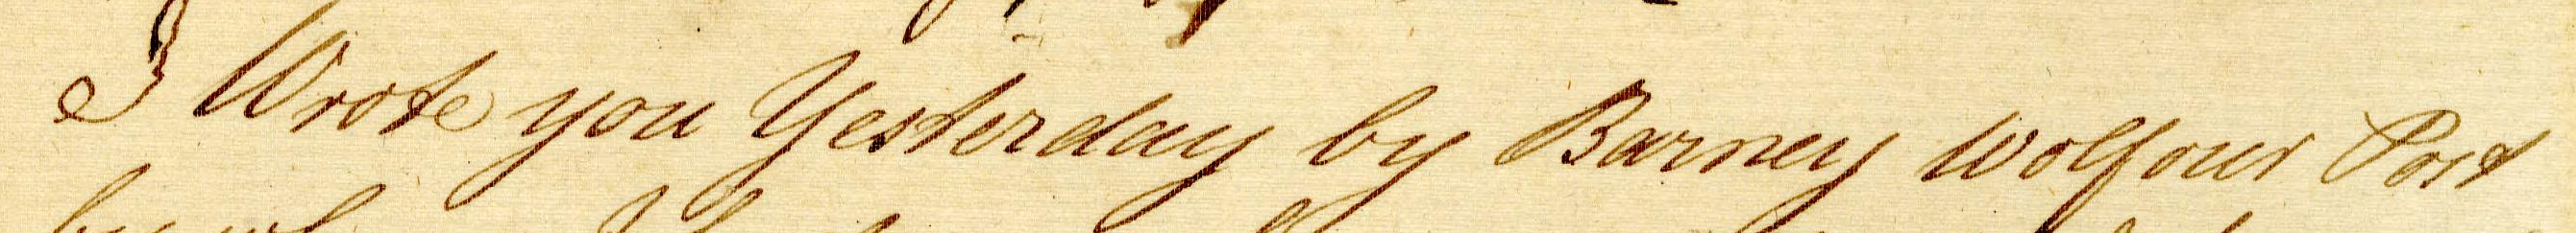I Wrote you Yesterday by Barney Wolf our Post
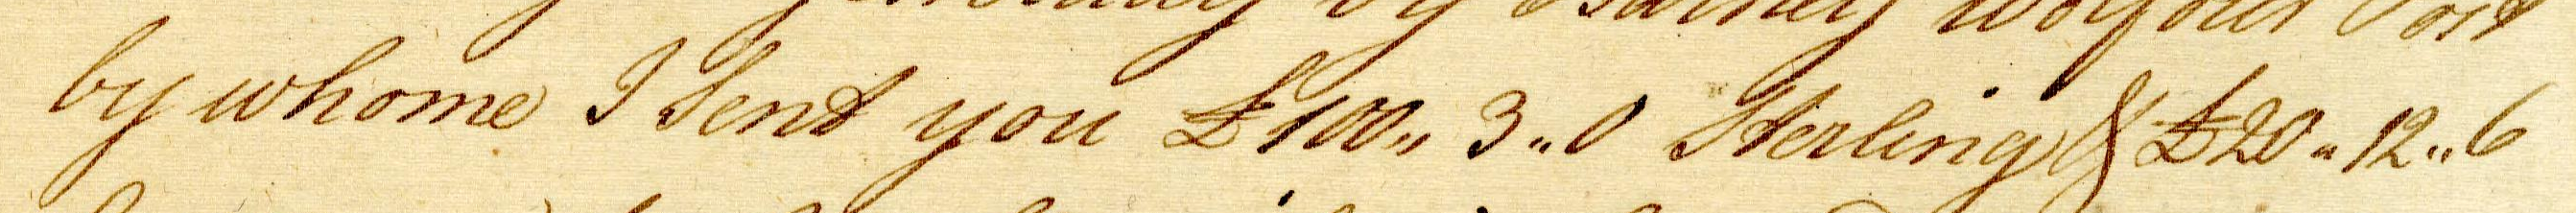by whome I send you £100..3..0 Sterling & £20..12..6
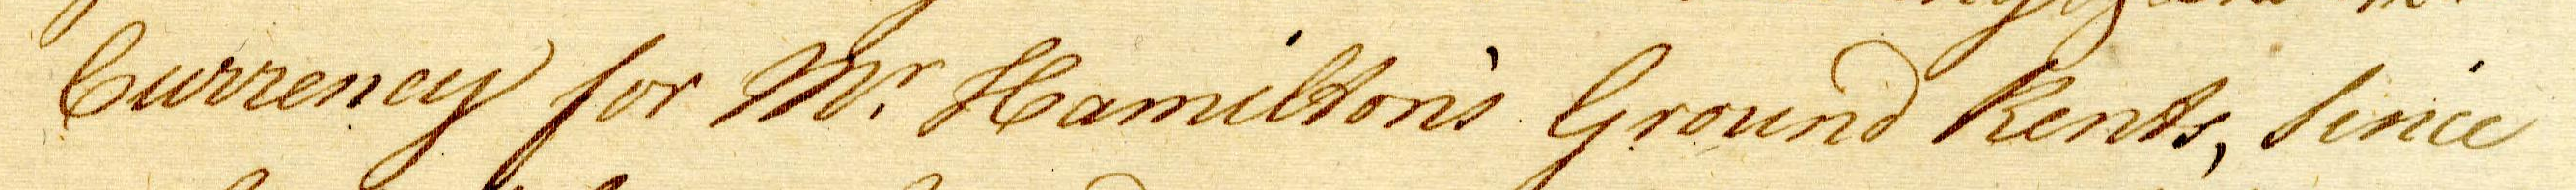Currency for M^r. Hamilton's Ground rents, Since
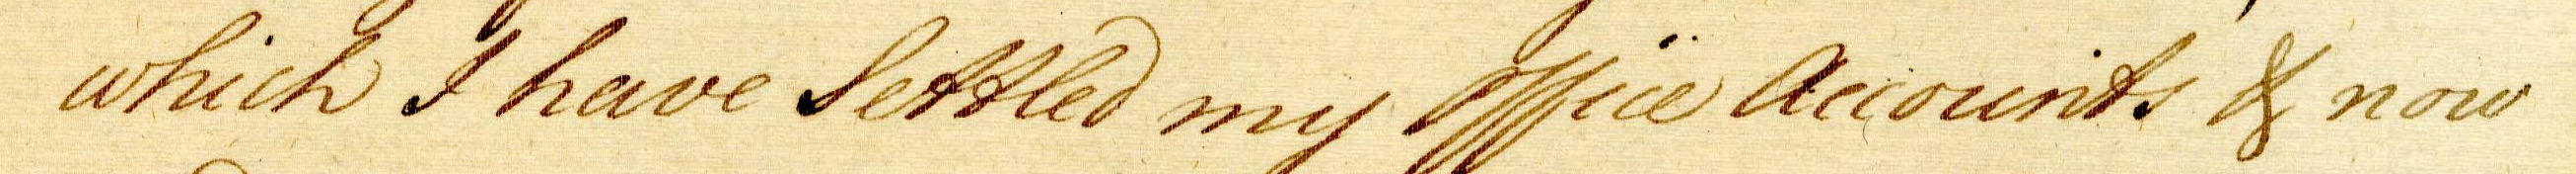which I have Settled my office Accounts & now
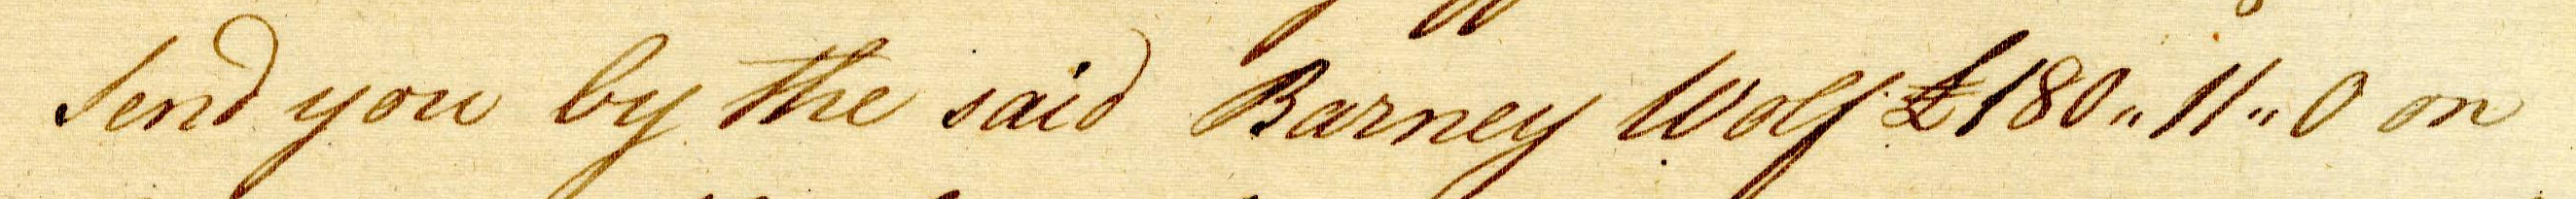Send you by the said Barney Wolf £180..11..0 on
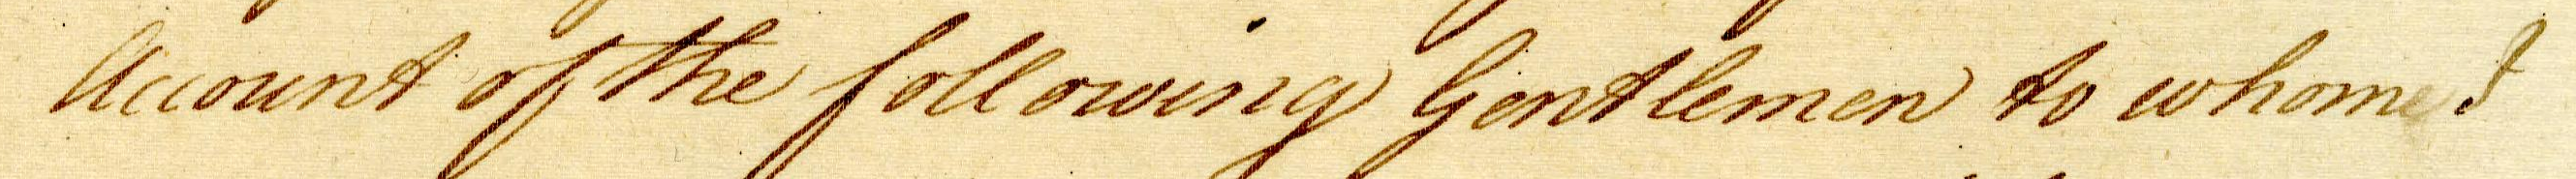Account of the following Gentlemen to whome I
